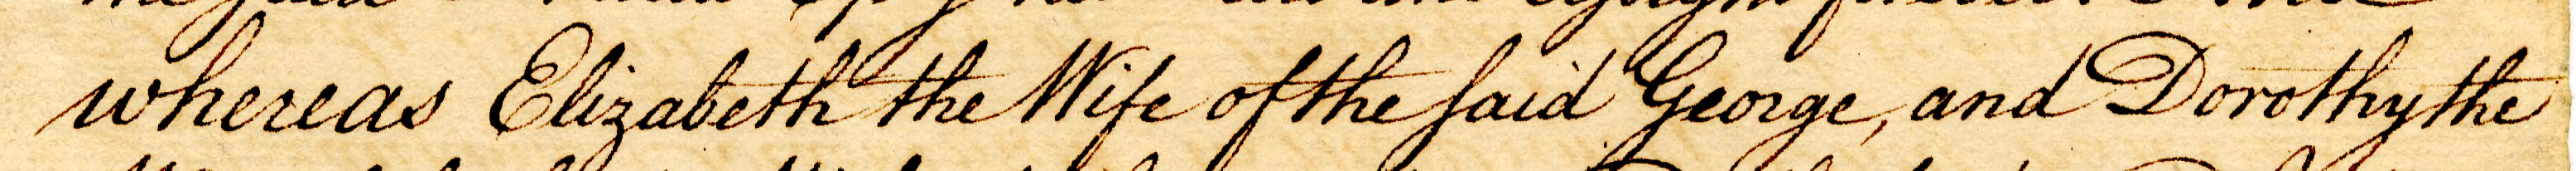whereas Elizabeth the Wife of the said George, and Dorothy the
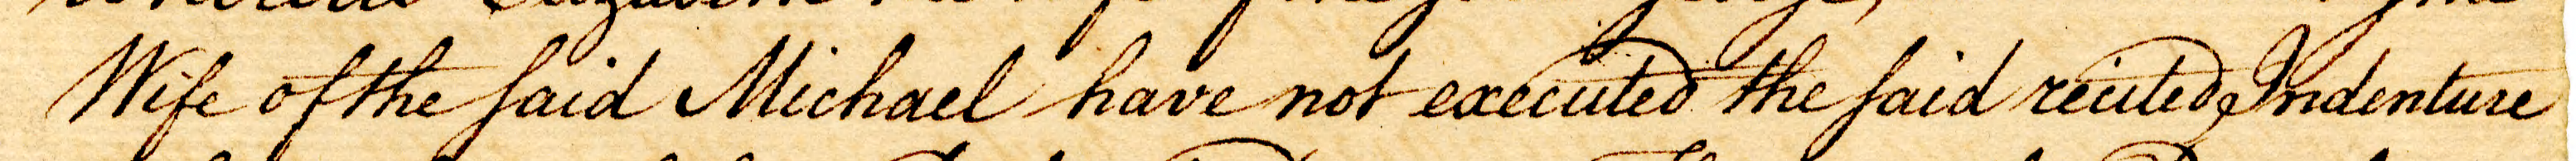Wife of the said Michael have not executed the said recited Indenture
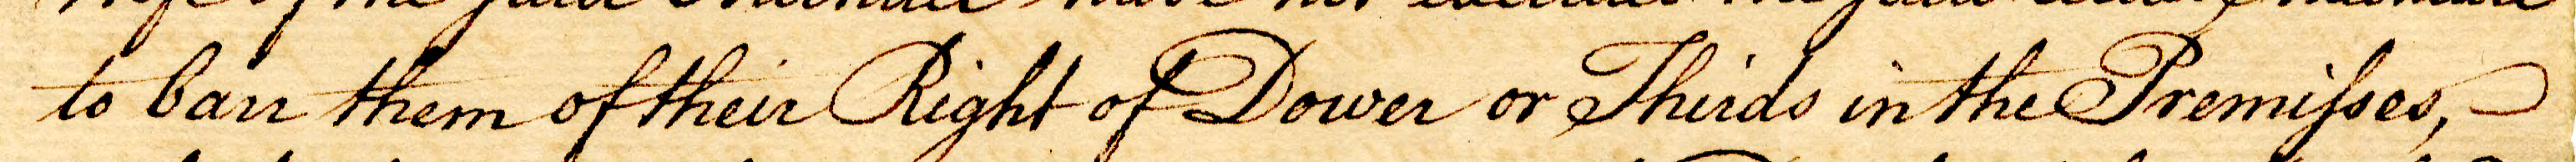to ban them of their Right of Dower or Thirds in the Premisses,
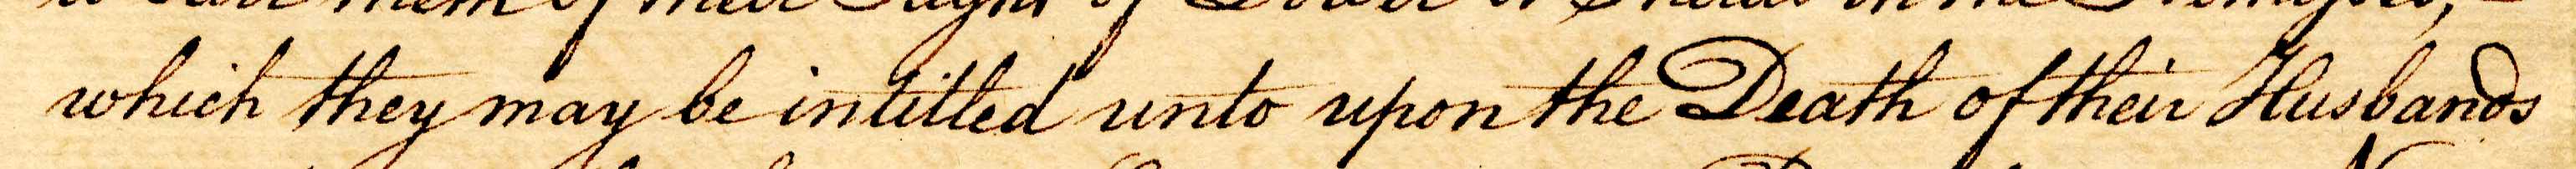which they may be intitled unto upon the Death of their Husbands
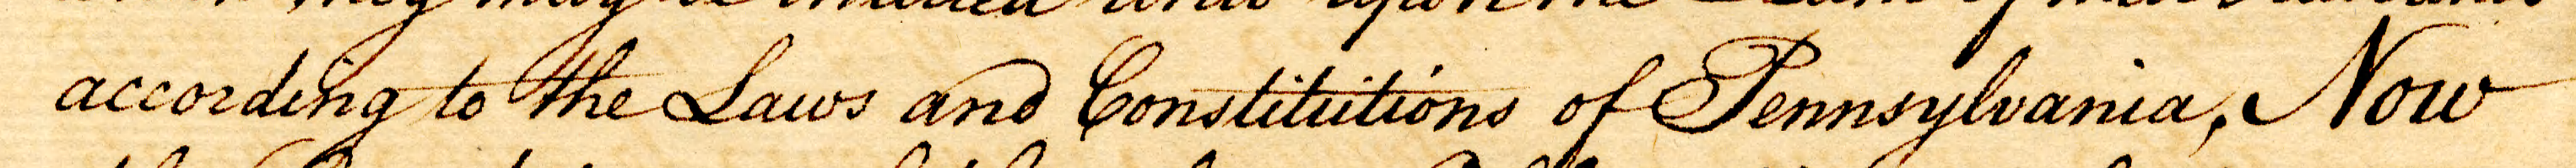according to the Laws and Constitutions of Pennsylvania. Now
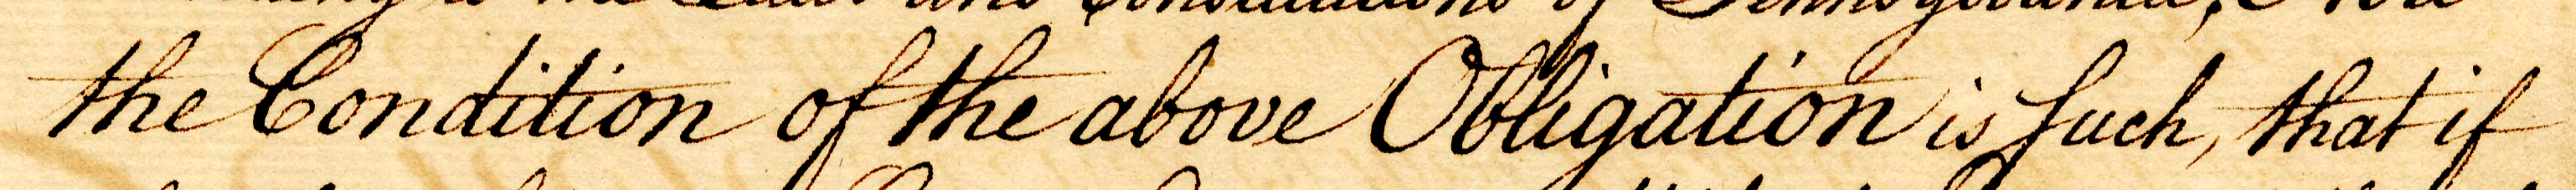the Condition of the above Obligation is such, that if
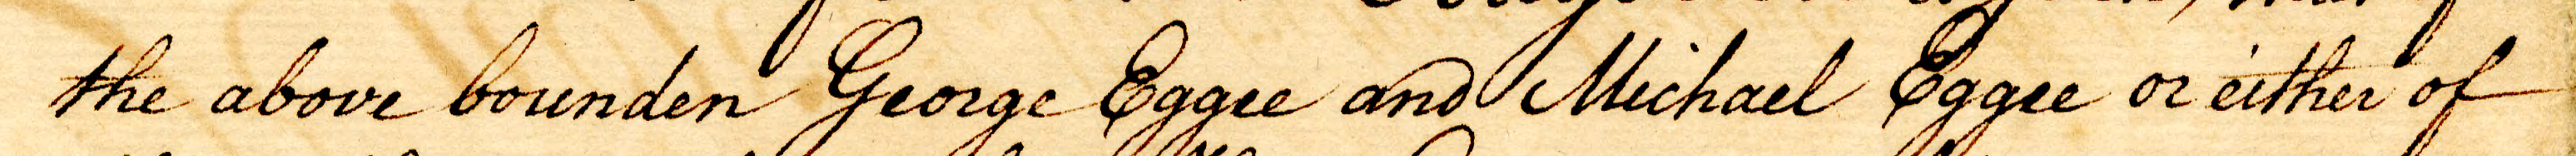the above bounden George Eggee and Micheal Eggee or either of
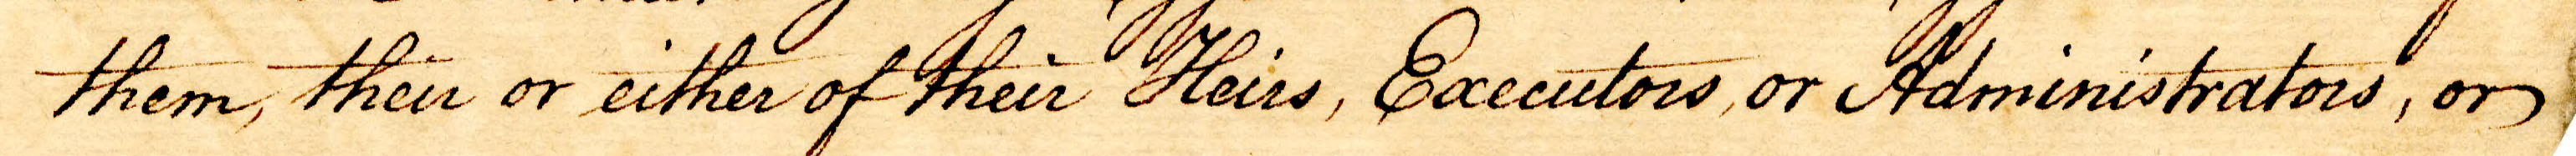them, their or either of their Heirs, Executors, or Administrators, or
